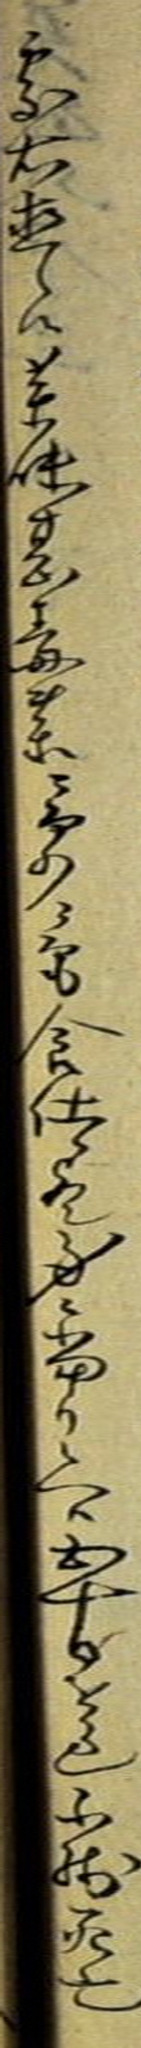処右直し候薬味甚毒薬ニ而少ニ而も食仕候歟身ニ当り候ヘハ五十日を過不残死亡
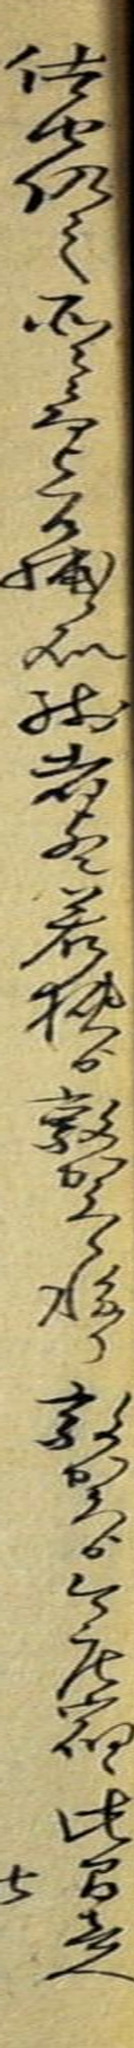仕候由仍之所々ニ而被召捕候処残者歟若狭ゟ敦賀へ移り敦賀ゟ今庄宿へ此間壱人
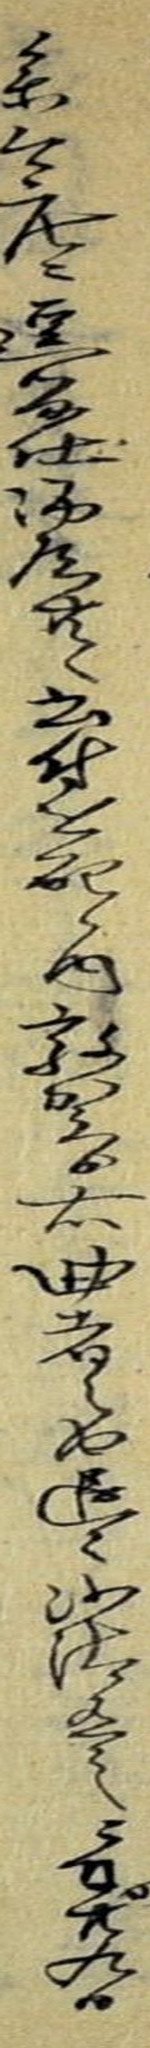参今庄ニ逗留仕酒屋共へ書付を配候内敦賀ゟ右曲者之由追々沙汰有之ニ付昨廿九日
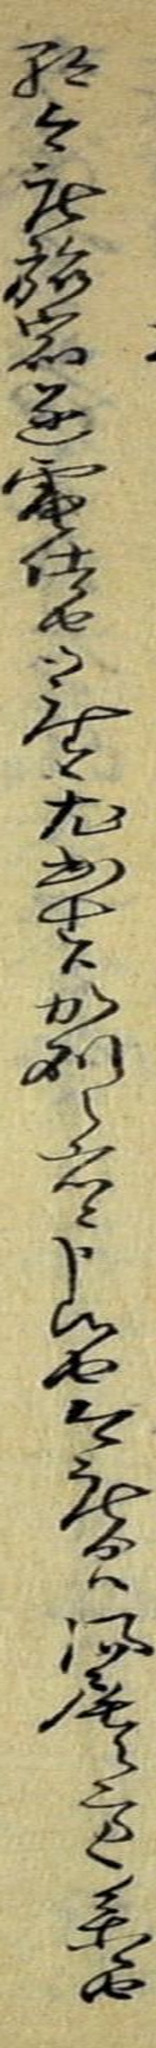於今庄旅宿逐電仕候由御座候尤出生ハ加州之者と申候由今庄ゟハ湯尾之方へ参候由
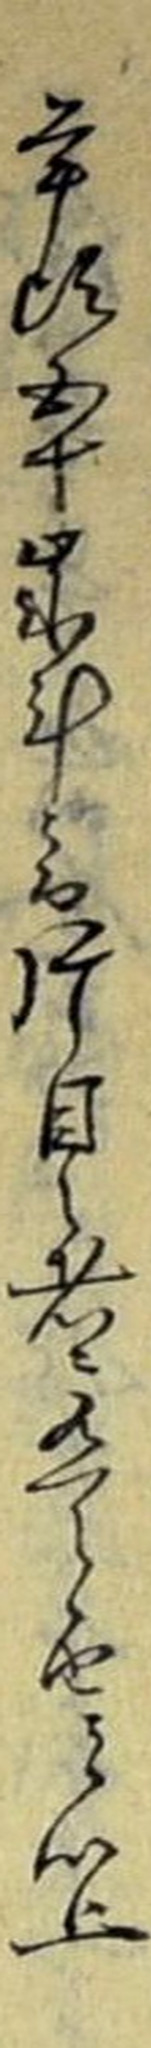年頃五十歳斗ニ而片目之者ニ有之候由ニ候以上
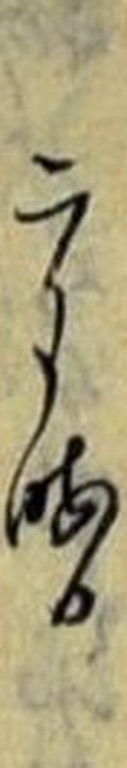二月晦日
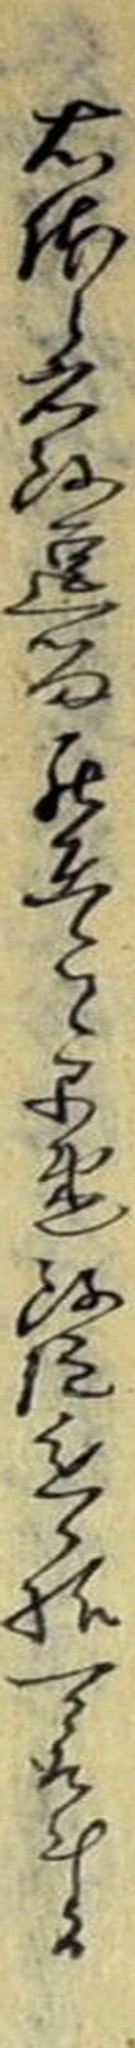右体之者致逗留罷在候ハヽ早速致注進候様可被取計旨
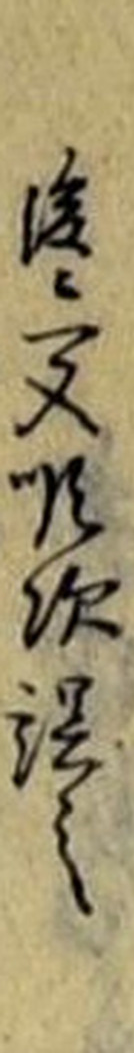後ニ可入順次之
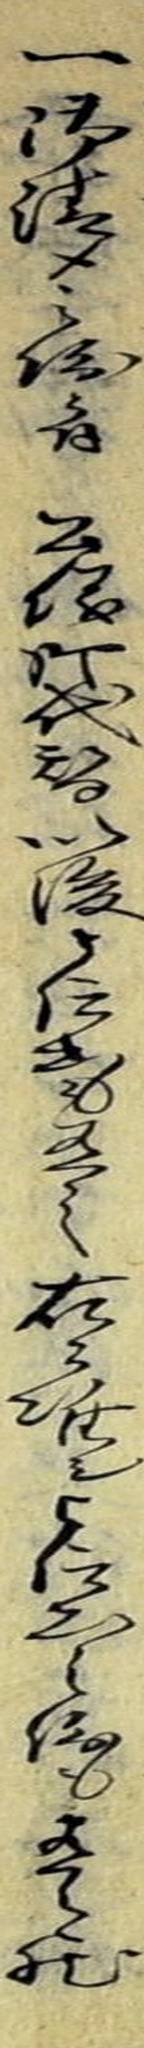一御清メ之儀ニ付公儀御代替以後被仰出も有之右ニ准シ被仰出之儀も有之候然
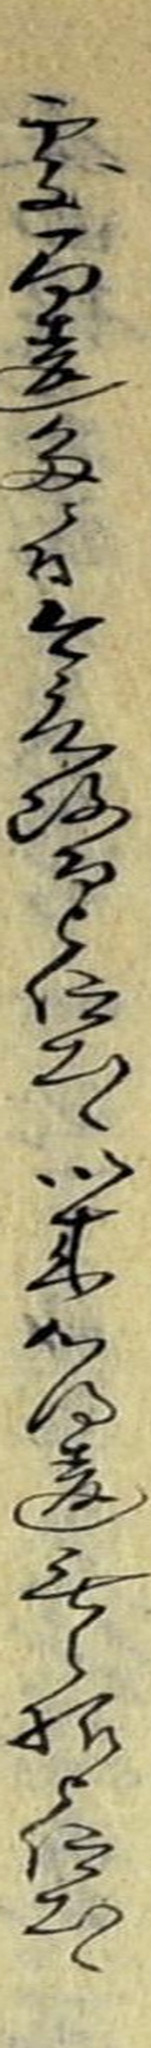処間違多ニ付今度改而被仰出候以来心得違無之様被仰出候
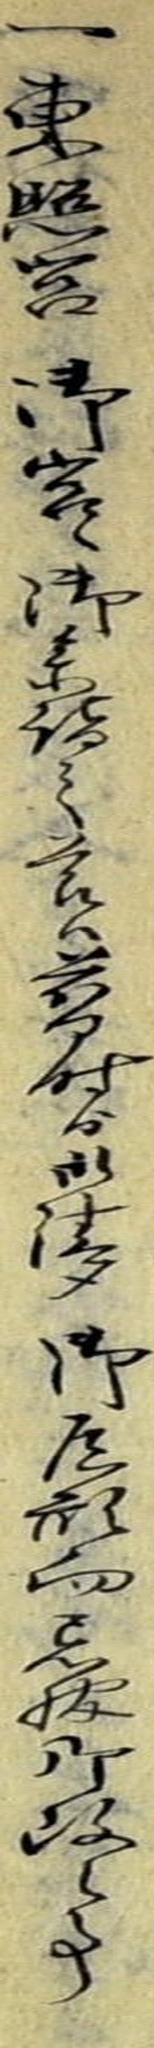一東照宮御宮へ御参詣之節ハ暮時ゟ御清メ御屋形向忌服御改之事
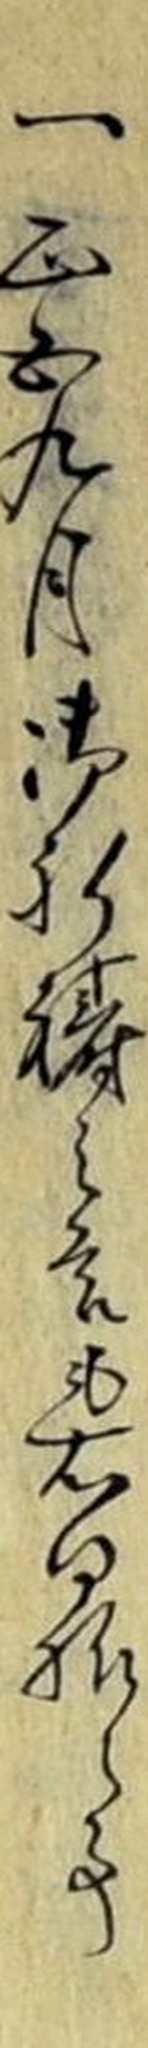一正五九月御祈祷之節も右同様之事
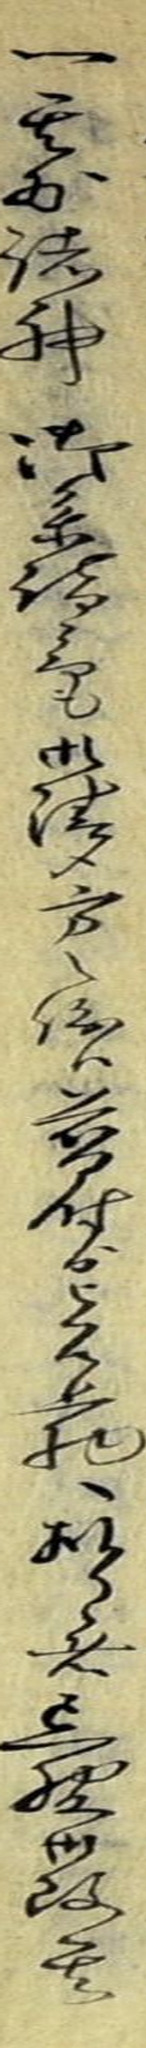一其外諸神御参詣ニ而も御清メ方之儀ハ暮時ゟ被召上物へ掛り候者忌服御改其
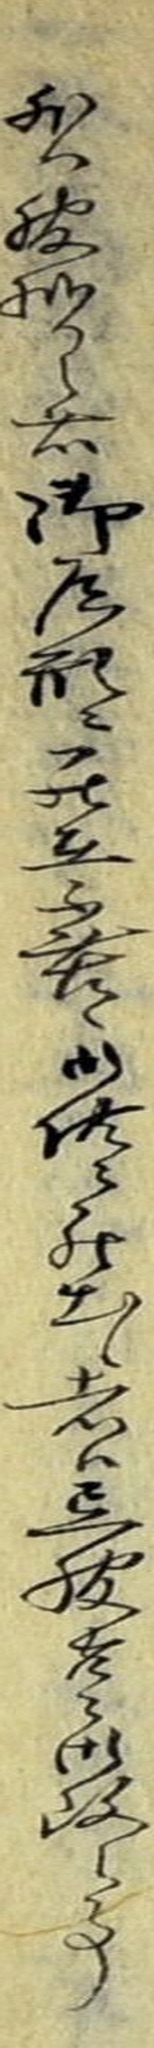外ハ服掛り之者御屋形ニ罷在不苦候御供ニ罷出候者ハ忌服共ニ御改之事
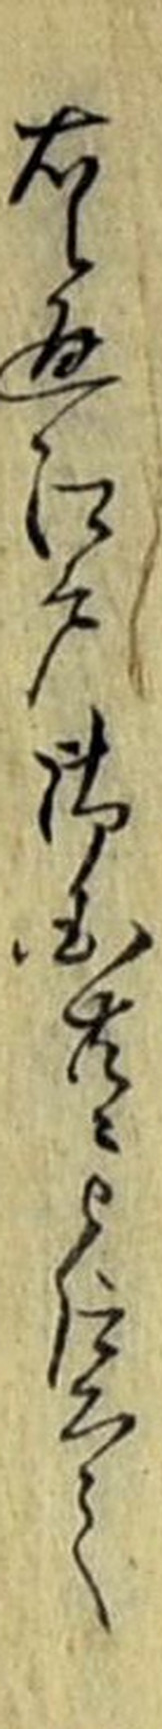右之通江戸御国共ニ被仰出之
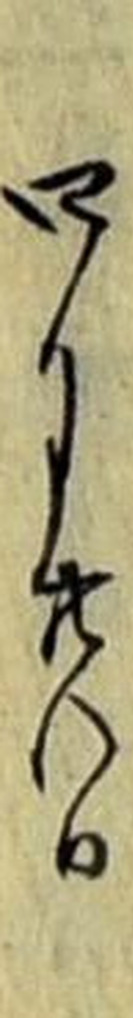四月廿八日
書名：命令之部 三
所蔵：福井県文書館 Fukui Prefectural Archives
